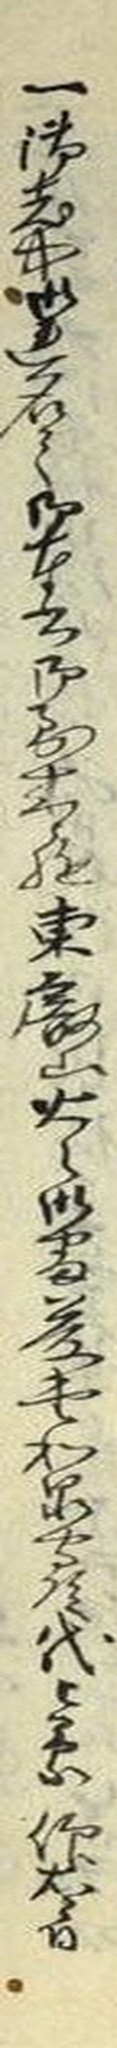一御老中御連名之御奉書御到来被遊東叡山火之御番藤堂和泉守殿代被蒙仰右ニ付
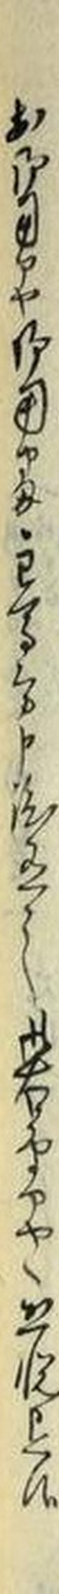於御用部屋御用番主馬方申渡有之御右筆部屋へ恐悦申上候
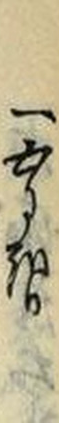一五月朔日
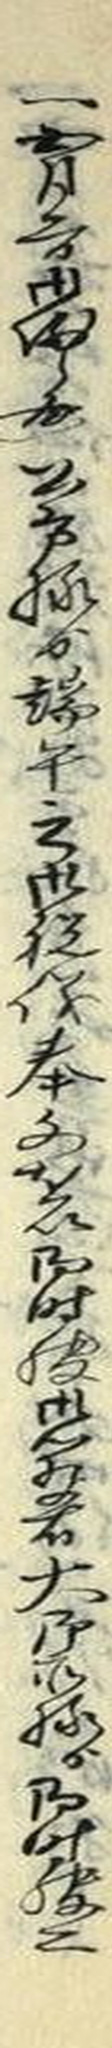一五月二日御例之通公方様ゟ端午之御祝儀奉文を以御時服御箱肴大御所様ゟ御時服二
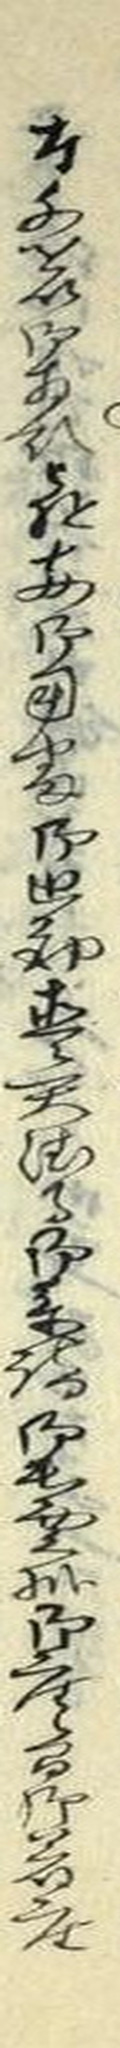奉文を以御拝領被遊両御用番御廻勤直ニ天徳寺御参詣御出殿掛御座之間御着座
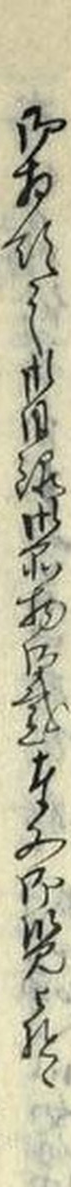御拝領之御目録御品物御戴奉文御覧被遊候
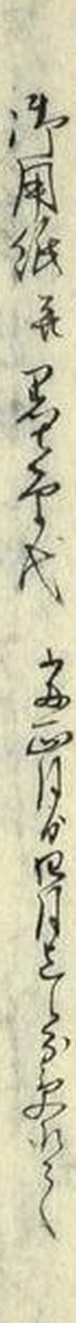御用紙幷墨筆代当正月ゟ四月迄之分受取之
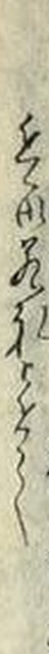進候御答礼被進之
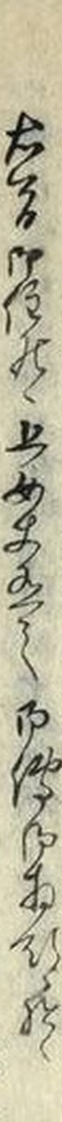右今日御住居へ上女使有之御伝御拝領被遊候
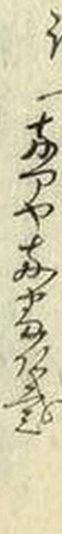両部屋両番頂戴

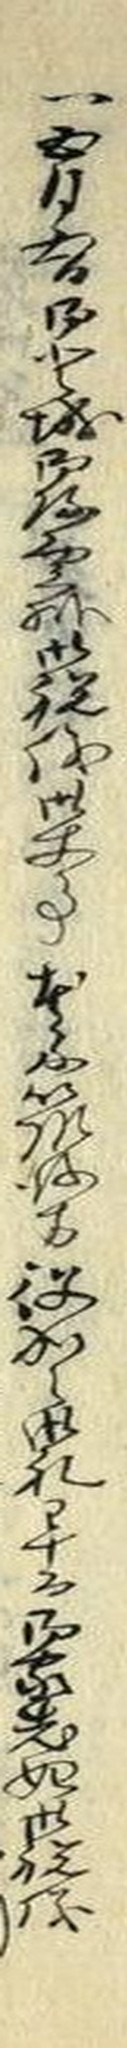御登城御帰殿掛御祝儀御使事本多筑後方役成之御礼畢而御家老始御祝儀如例
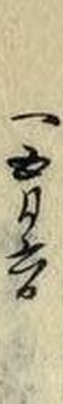一五月六日
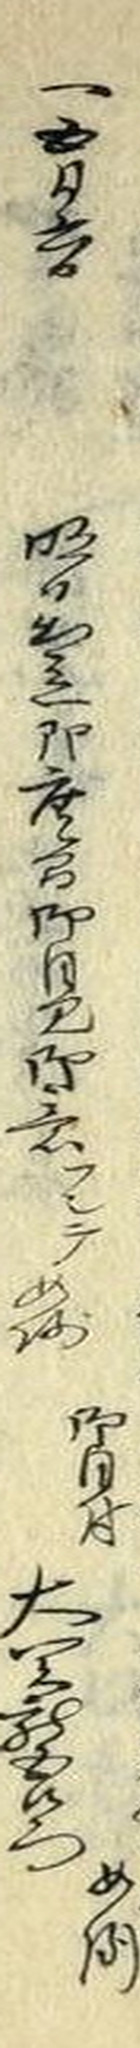明日出立御座之間御目見御意ブジデ如例御目付大関新五左衛門
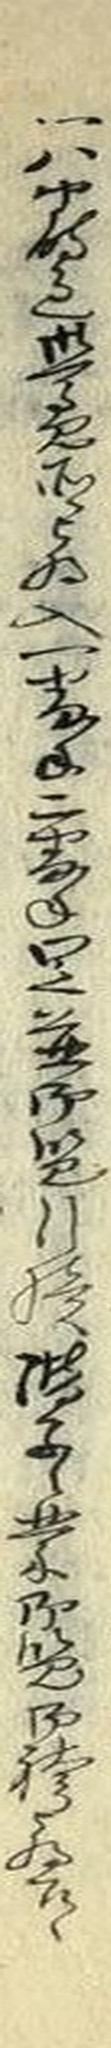一八半時過御馬見所へ被為入一番手二番手足並御覧引続階子之業御覧御袴被為召候
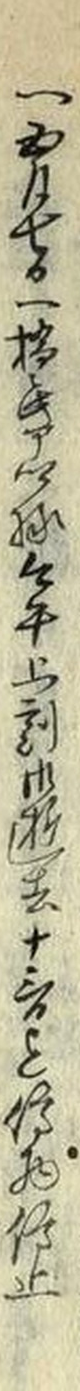一五月七日一橋民部卿様今午上刻御逝去十三日迄鳴物停止
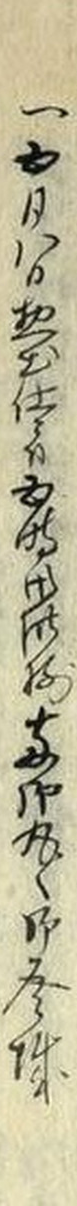一五月八日惣出仕ニ付五時御供揃両御丸へ御登城
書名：少傅日録抄（斉善付側向頭取日記、在府）
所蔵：福井県文書館 Fukui Prefectural Archives
